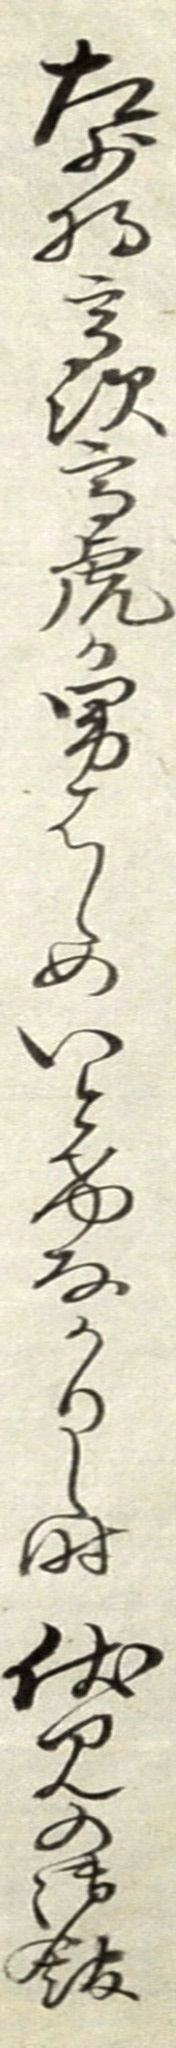左少将高次高虎か男はしめいとけなかりし時伏見の御館
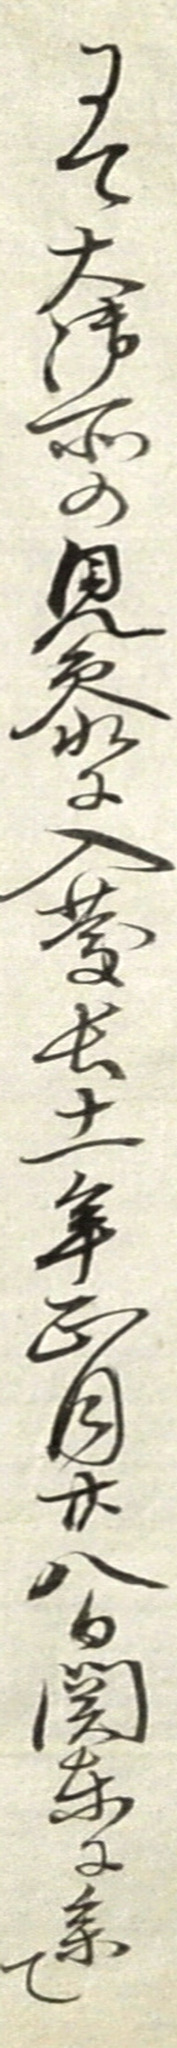にて大御所の見参に入慶長十一年正月廿八日関東に参て
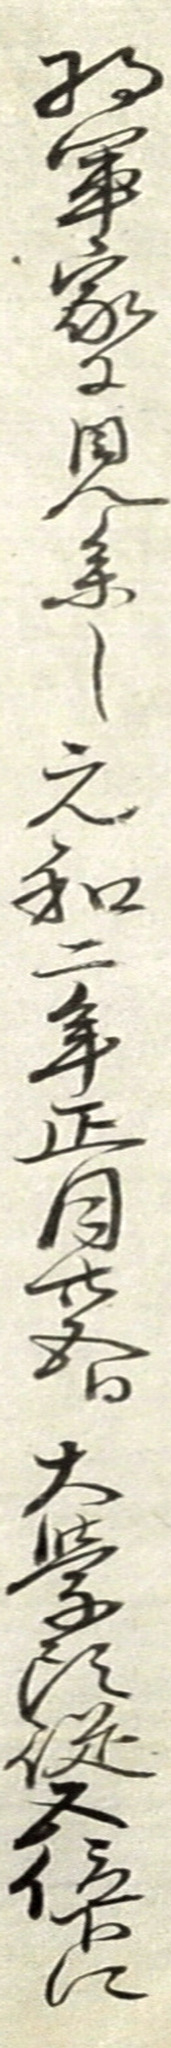将軍家に見参し元和二年正月廿五日大学頭従五位下に
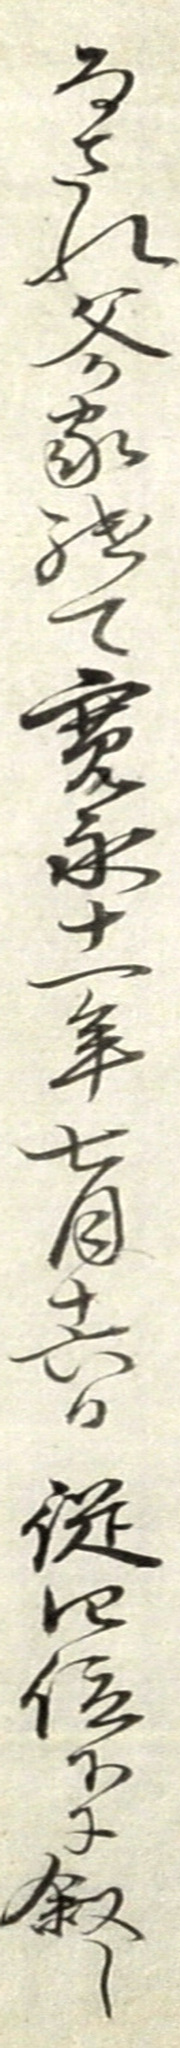なされ父か家継て寛永十一年七月十六日従四位下に叙し
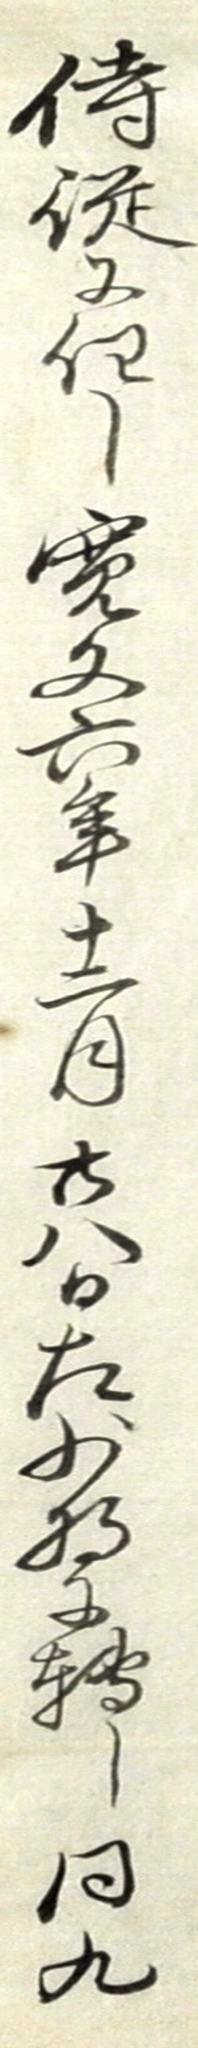侍従に任し寛文六年十二月廿八日左少将に転し同九
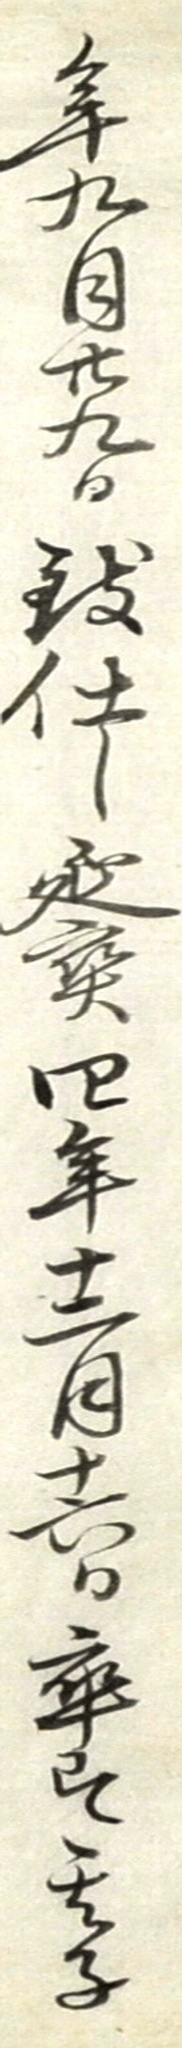年九月廿九日致仕し延宝四年十二月十六日卒す其子
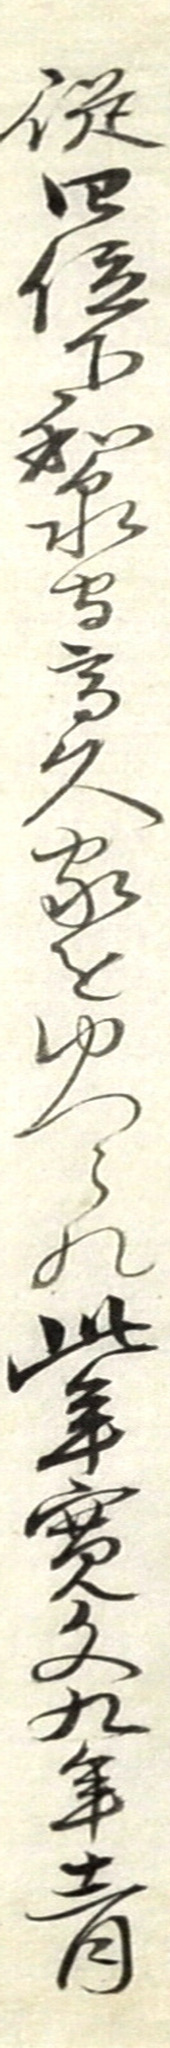従四位下和泉守高久家をゆつられ此年寛文九年十二月
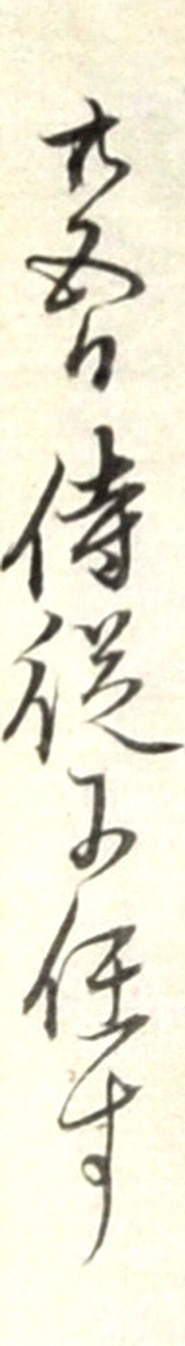廿五日侍従に任す
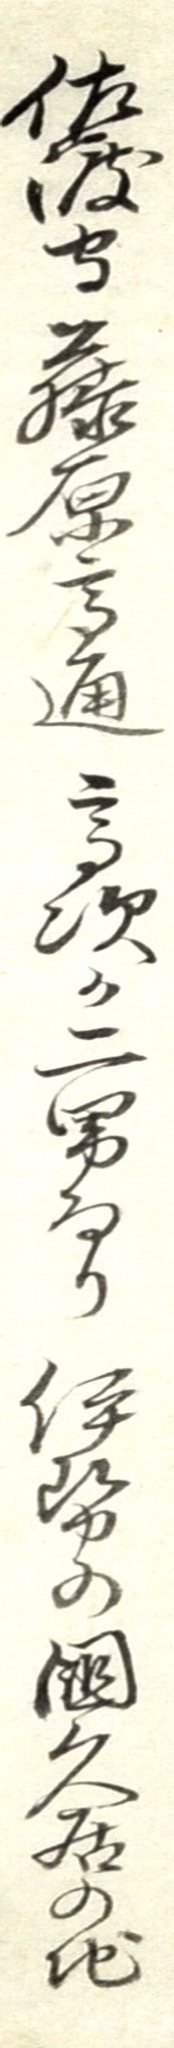佐渡守藤原高通高次か二男なり伊勢の国久居の地
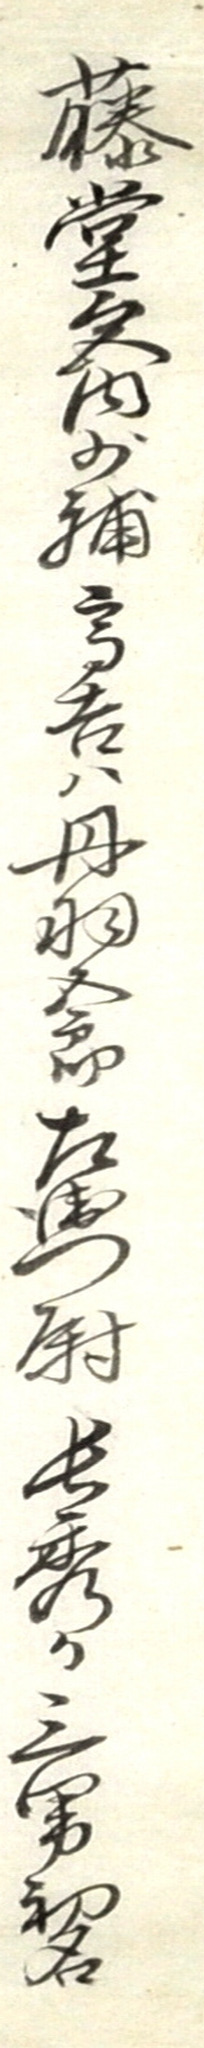藤堂宮内少輔高吉は丹羽五郎左衛門尉長秀か三男初名
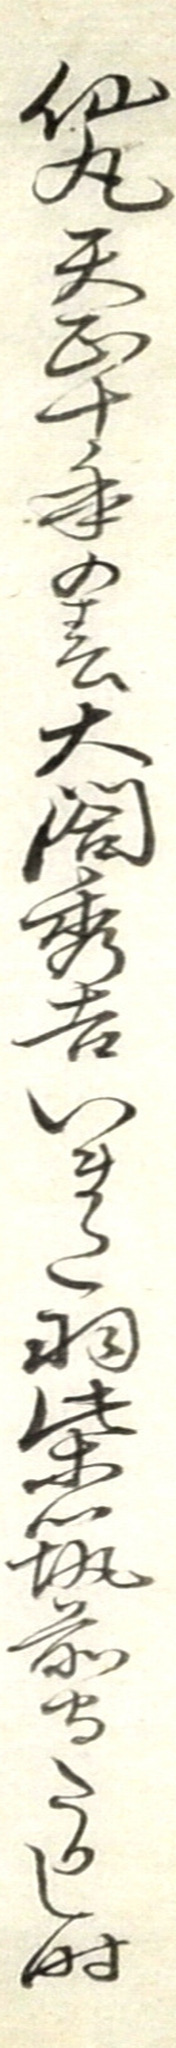仙丸天正十年の春大閤秀吉いまた羽柴筑前守たりし時
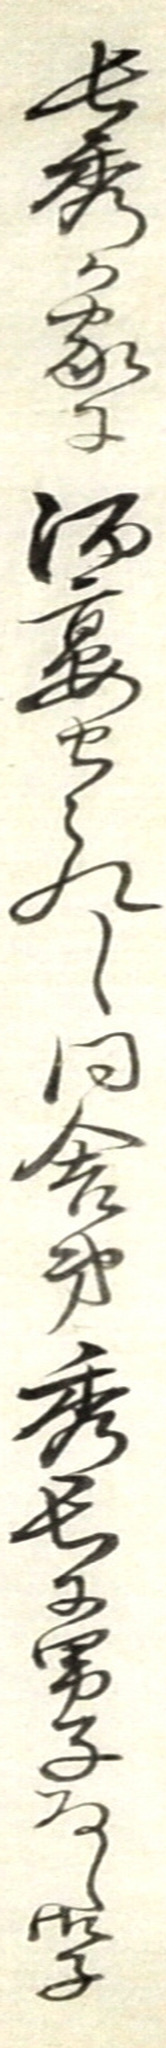長秀か家に酒宴せられし同舎弟秀長に男子なし御子
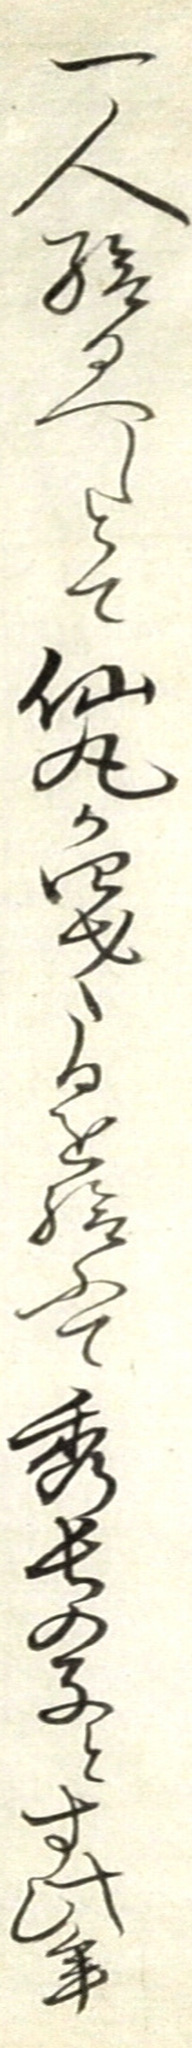一人給るへしとて仙丸か四才たるを給ふて秀長の子とす此年
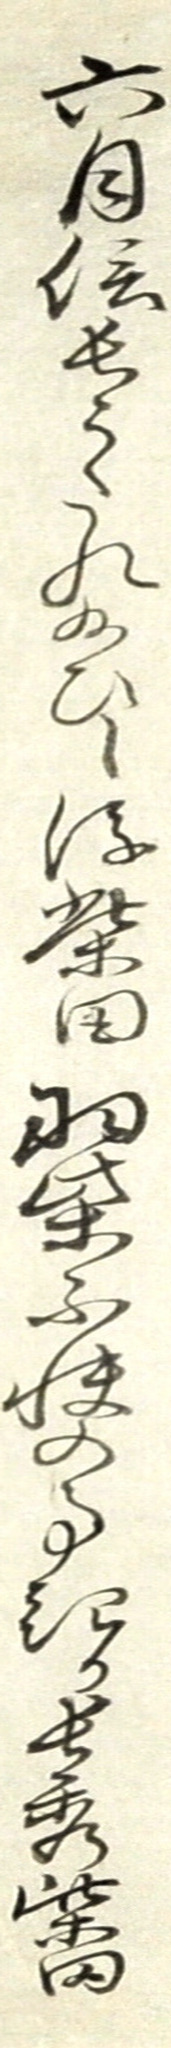六月信長うたれ給ひし後柴田羽柴不快の事起り長秀柴田
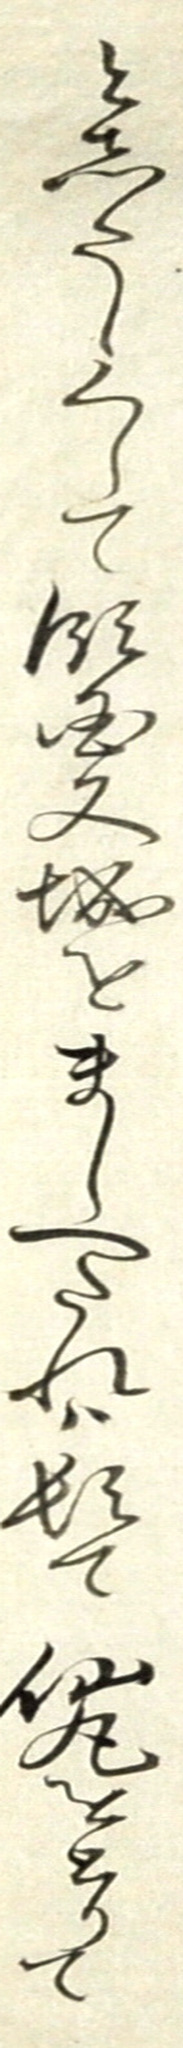としたしくして領国又城をましへたれは頓て仙丸をとりて
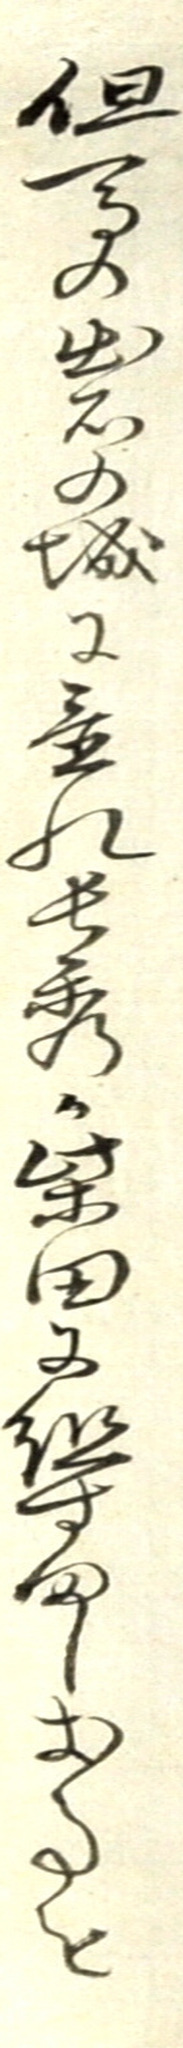但馬の出石の城に置れ長秀か柴田に組すましき事を
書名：藩翰譜（七・下）
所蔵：伊那市立高遠町図書館・合同会社AMANE
